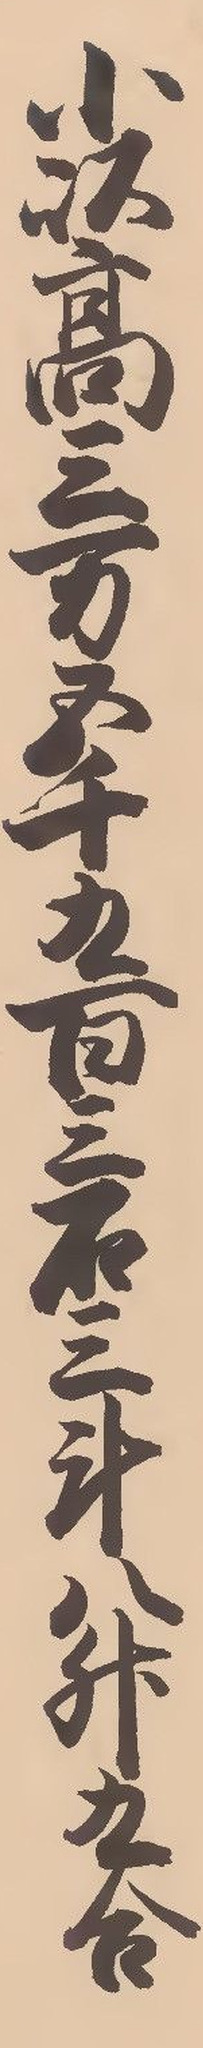小以高三万五千九百三石三斗八升九合
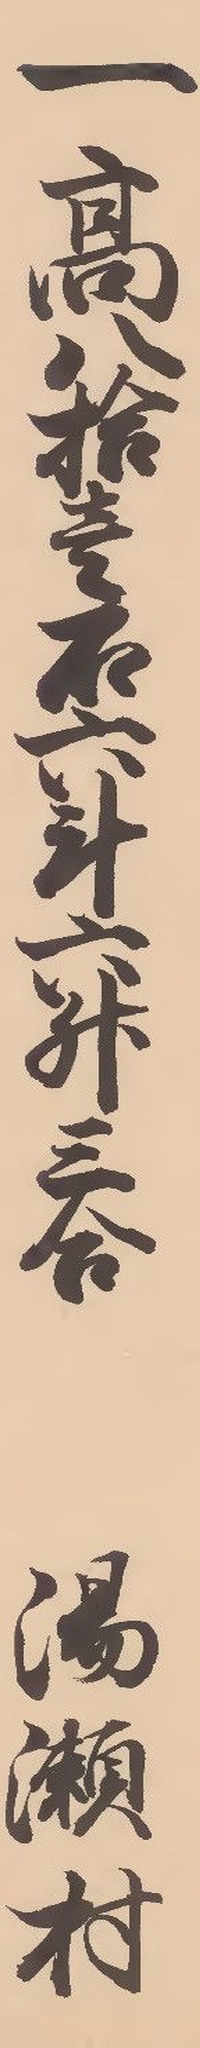一高八拾壱石六斗六升三合湯瀬村
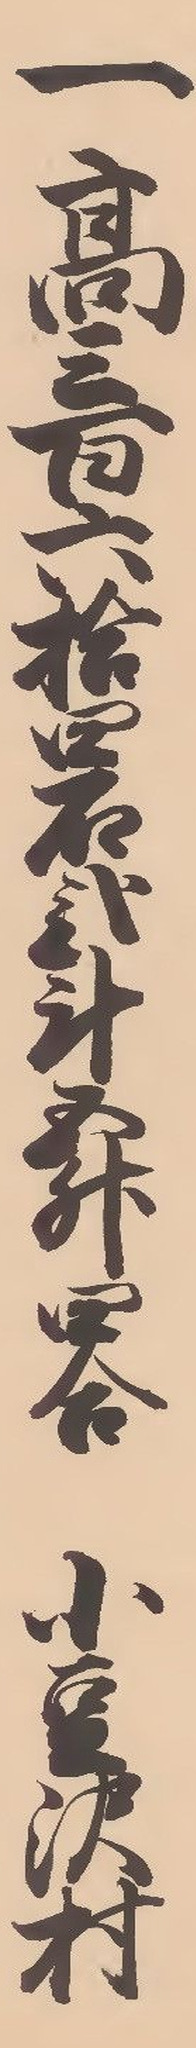一高三百六拾四石弐斗五升四合小豆沢村
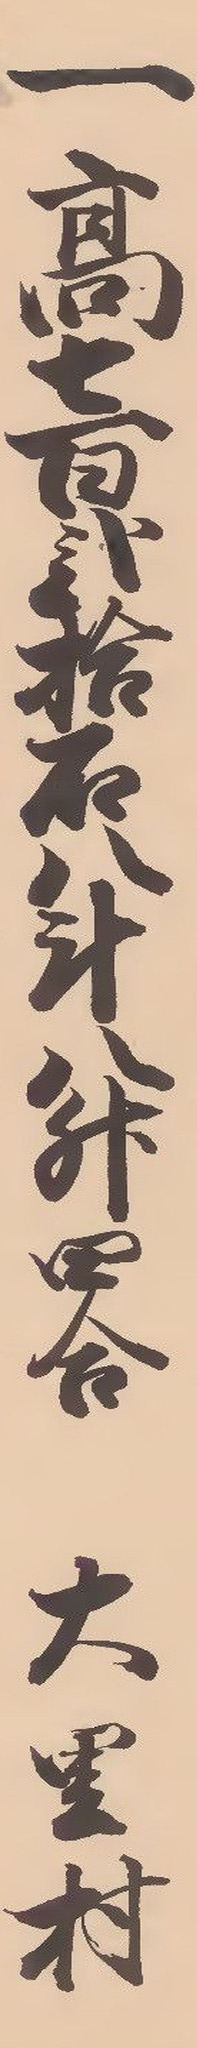一高七百弐拾石八斗八升四合大里村

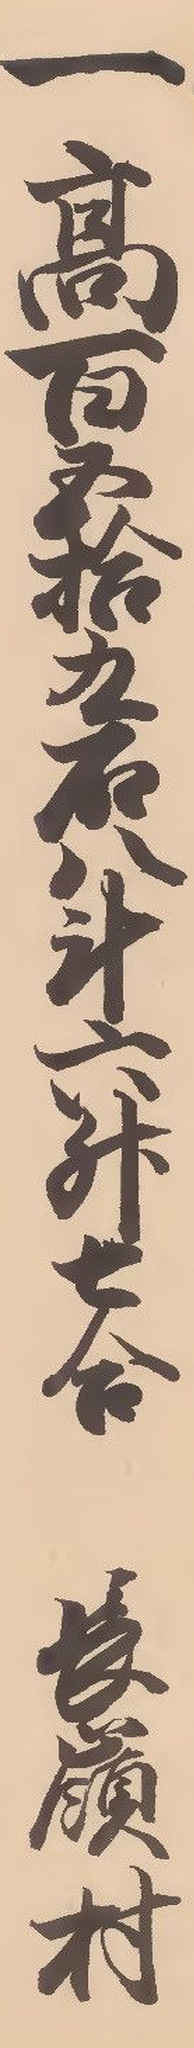一高百五拾九石八斗六升七合長嶺村
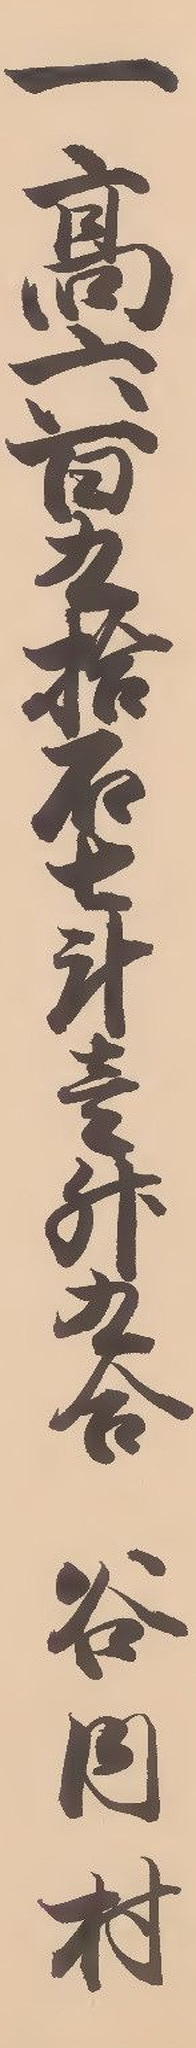一高六百九拾石七斗壱升九合谷内村
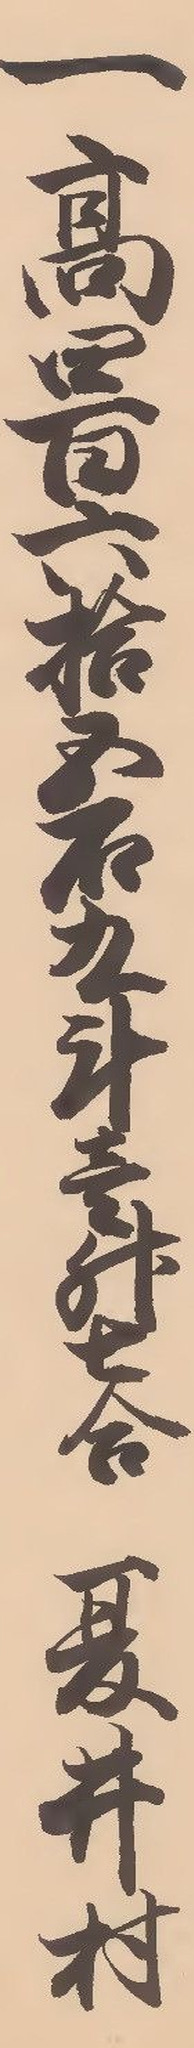一高四百六拾五石九斗壱升七合夏井村
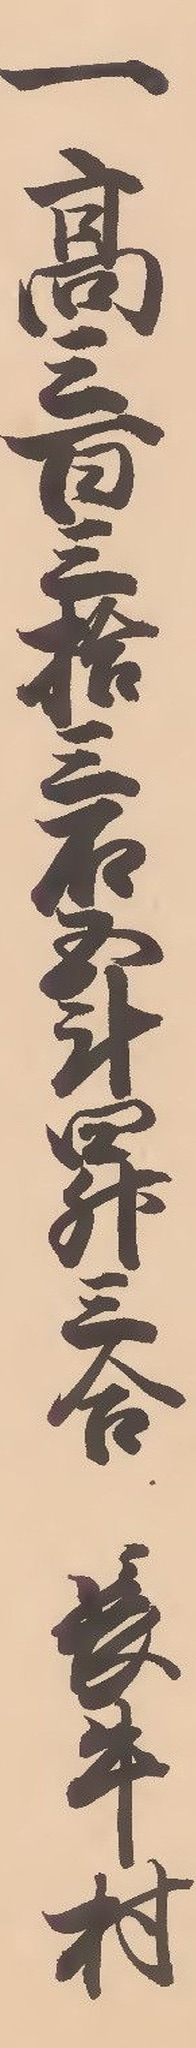一高三百三拾三石五斗四升三合長牛村
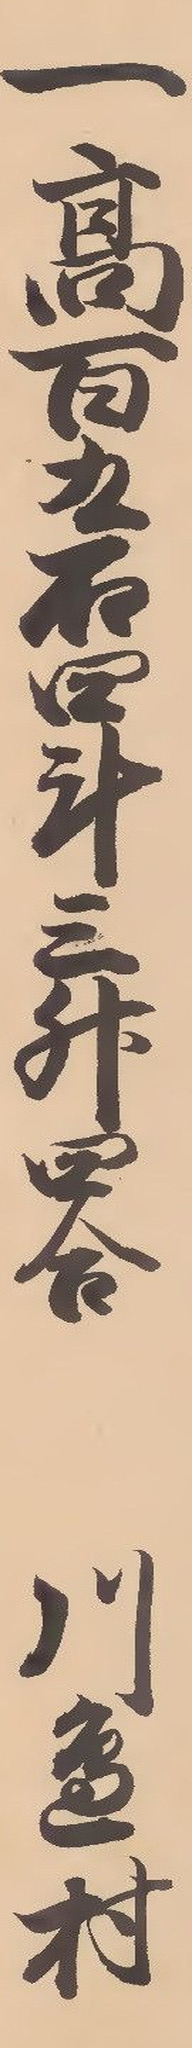一高百九石四斗三升四合川辺村
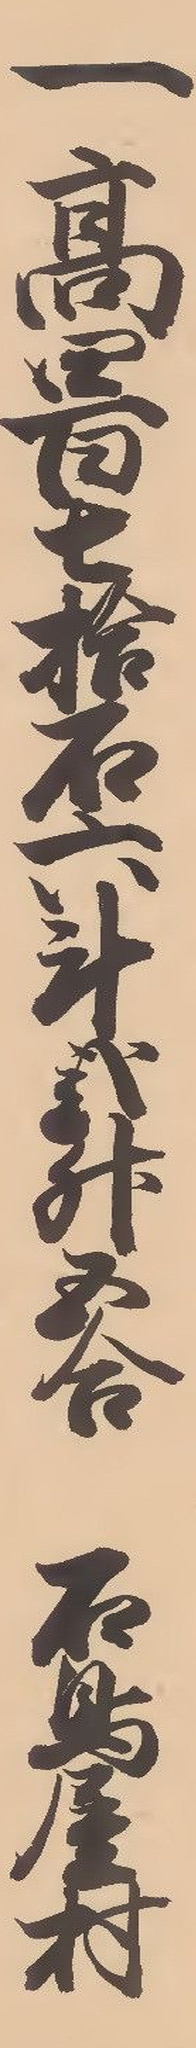一高四百七拾石六斗弐升五合石鳥屋村
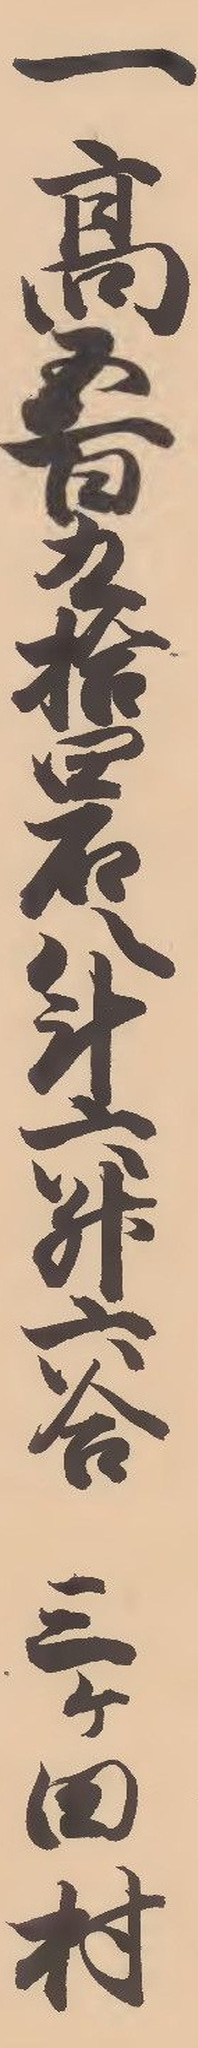一高五百九拾四石八斗六升六合三ヶ田村
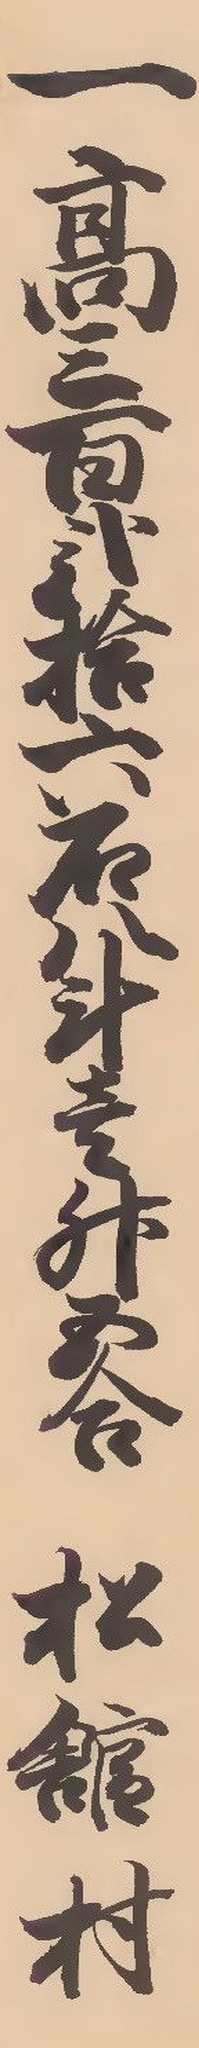一高三百弐拾六石八斗壱升五合松舘村

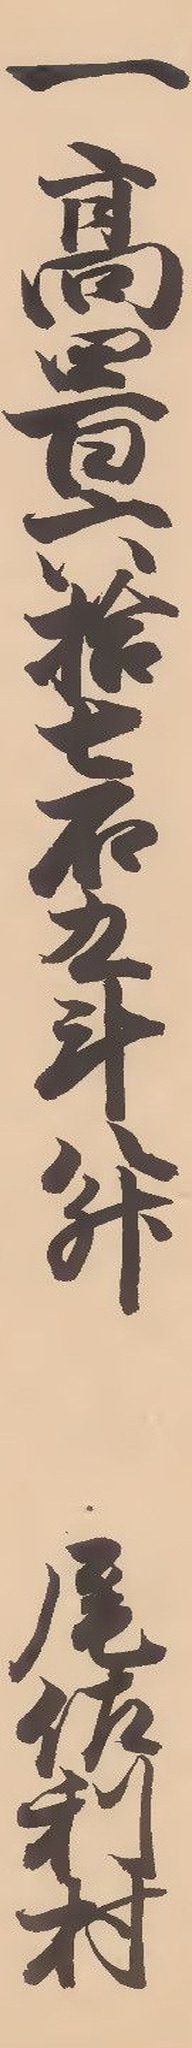一高四百六拾七石九斗八升尾佐利村
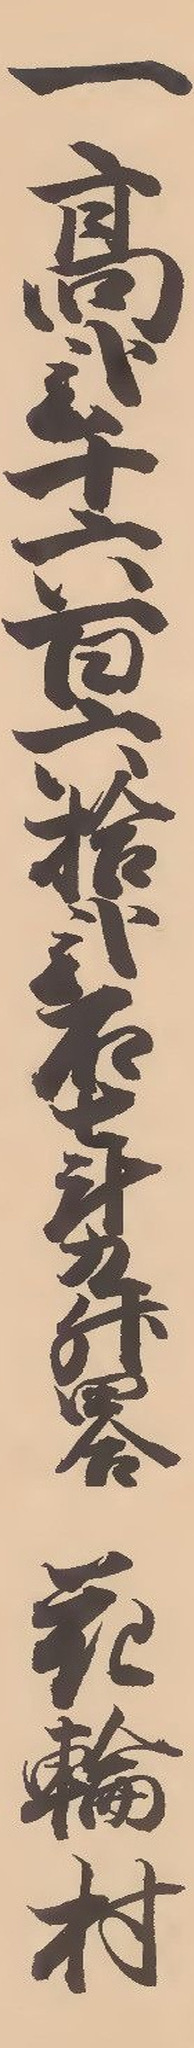一高弐千六百六拾弐石七斗九升四合花輪村
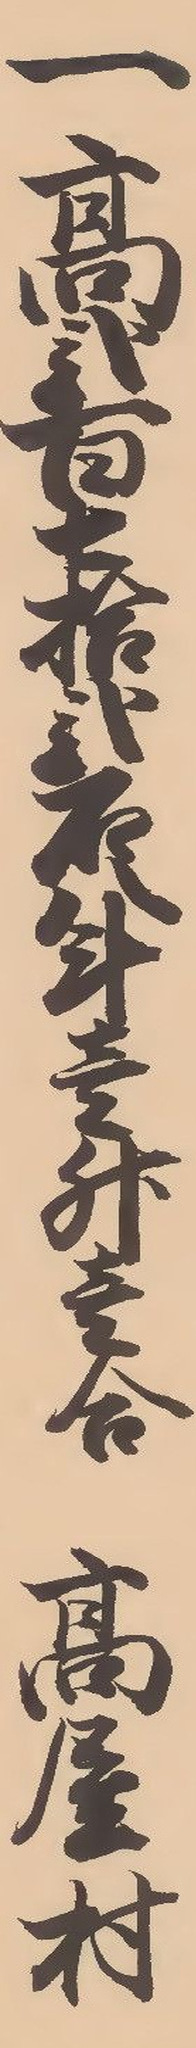一高弐百七拾弐石八斗壱升壱合高屋村
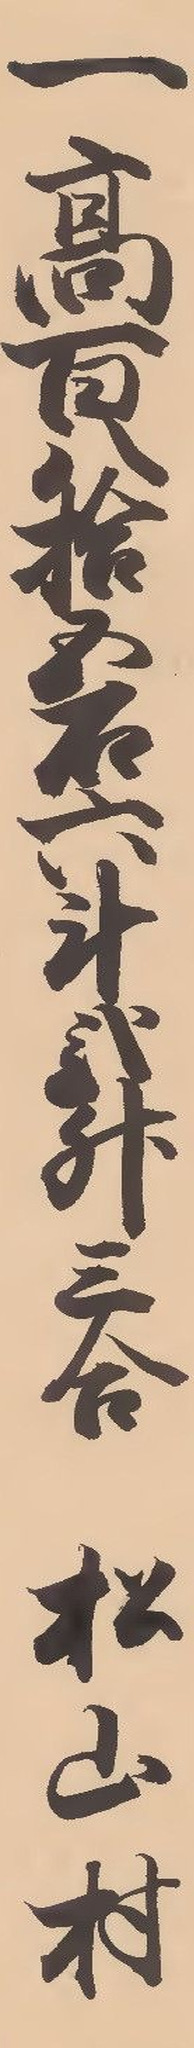一高百八拾五石六斗弐升三合松山村
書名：陸奥国郷帳　６
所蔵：国立公文書館 National Archives of Japan
